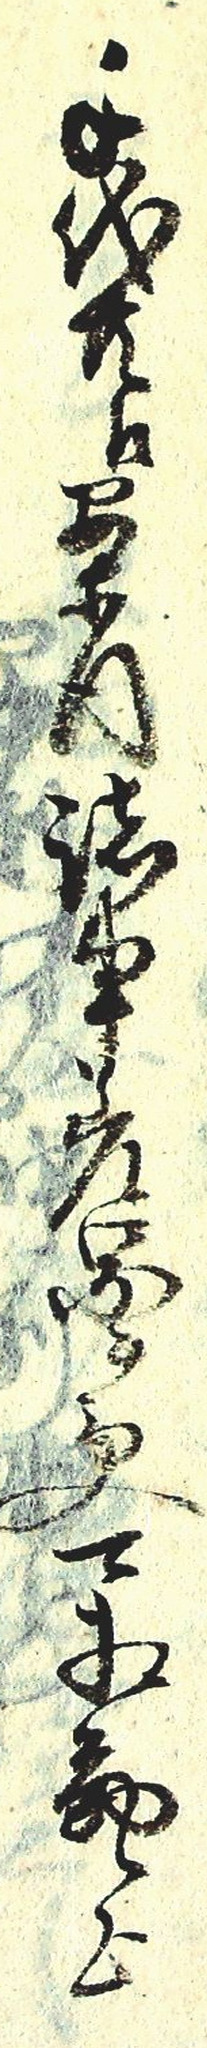手代共え案内諸事差図を受可相勤候以上
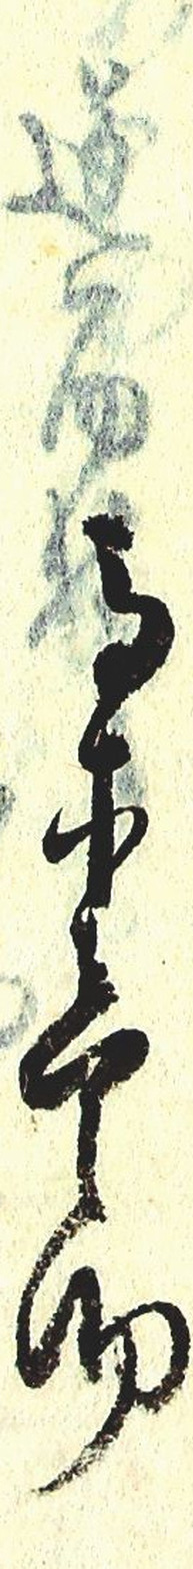高木真之助
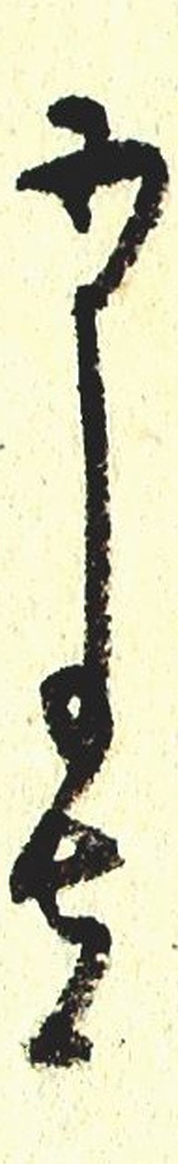五月七日
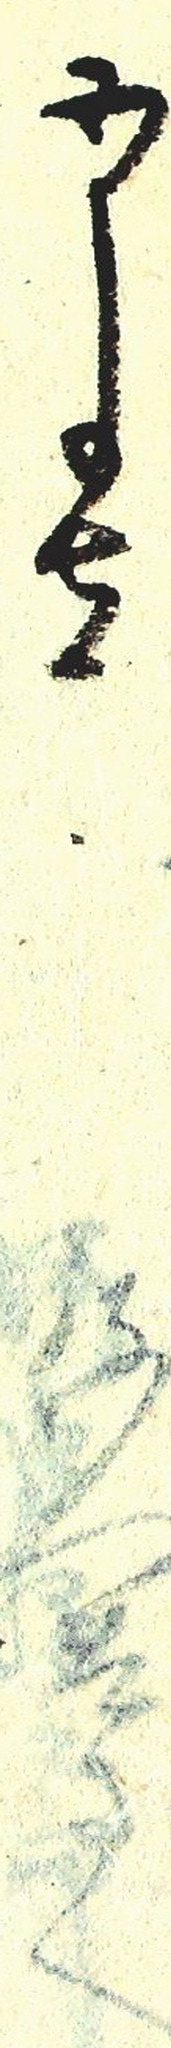五月七日
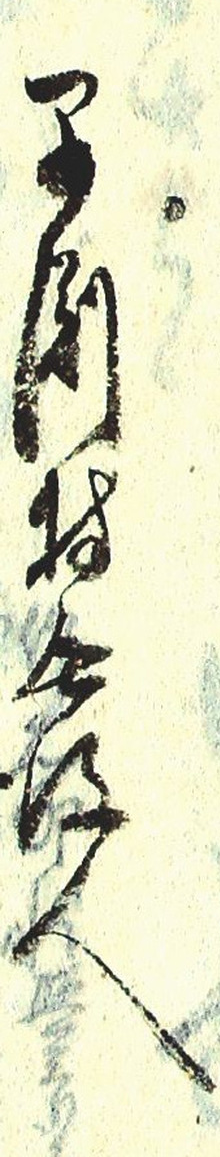早淵村無役人
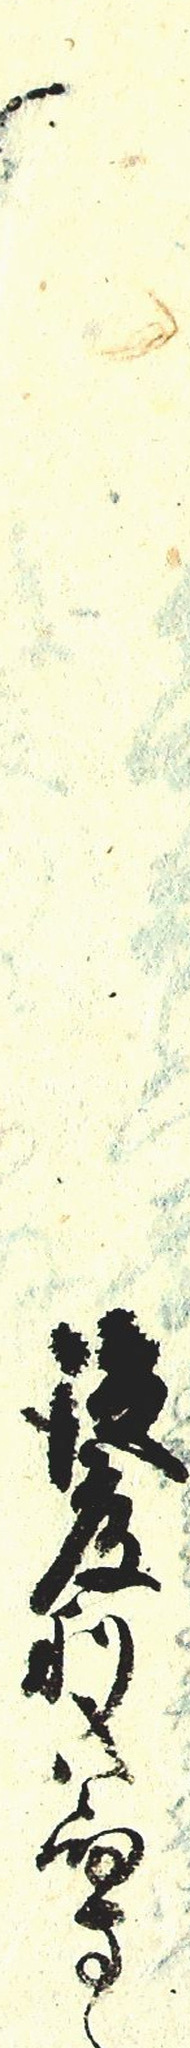後藤利八郎方へ
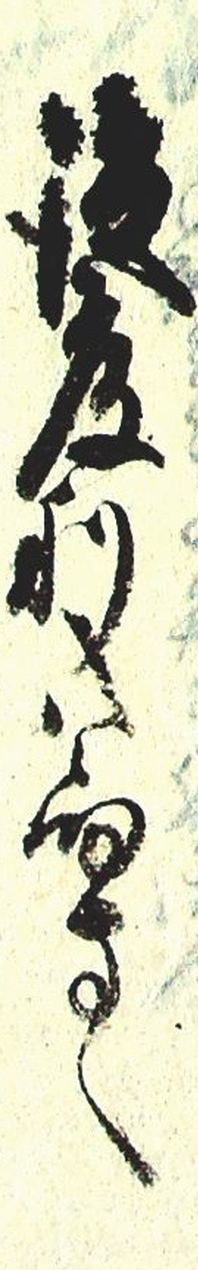後藤利八郎方へ
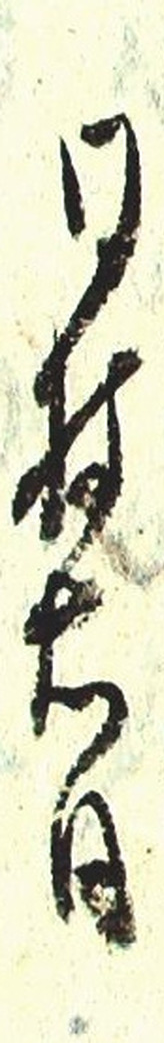同村右同

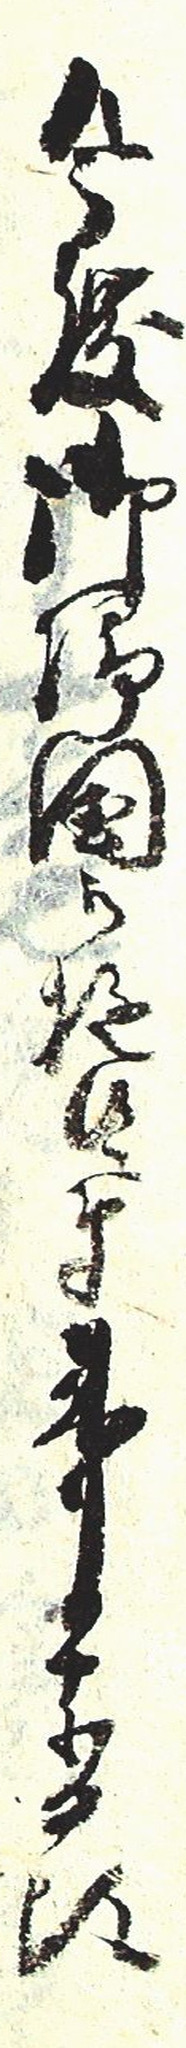今度御帰国被遊候に付来月十五日頃
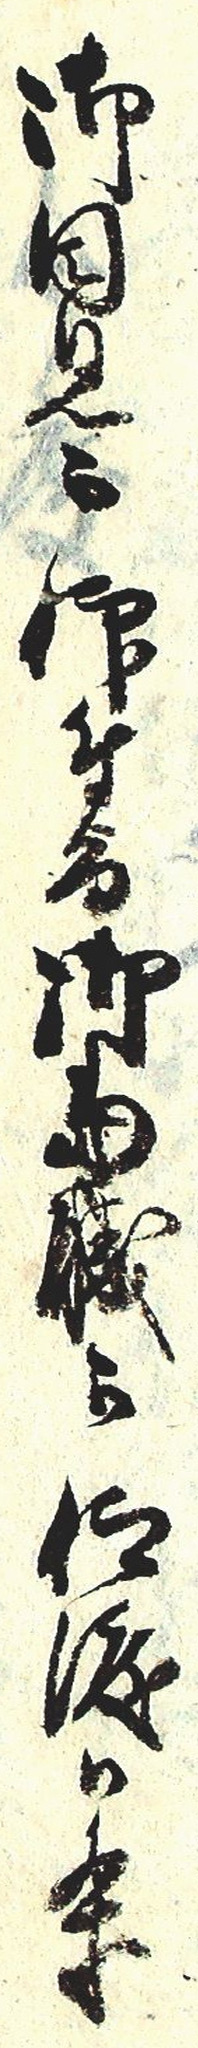御目見被仰付旨御当職被仰渡候条
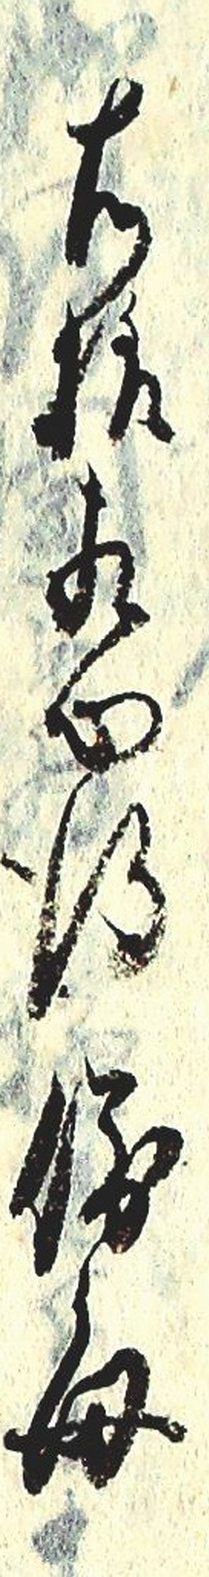左様相心得例毎
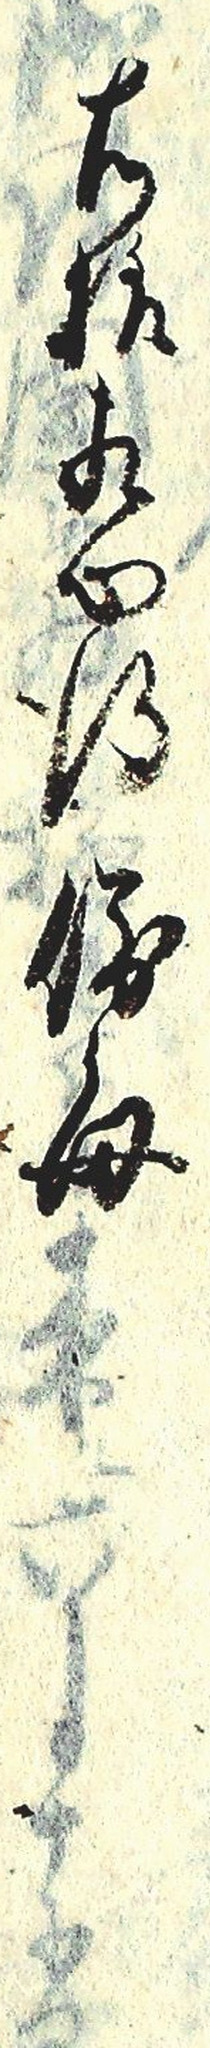左様相心得例毎
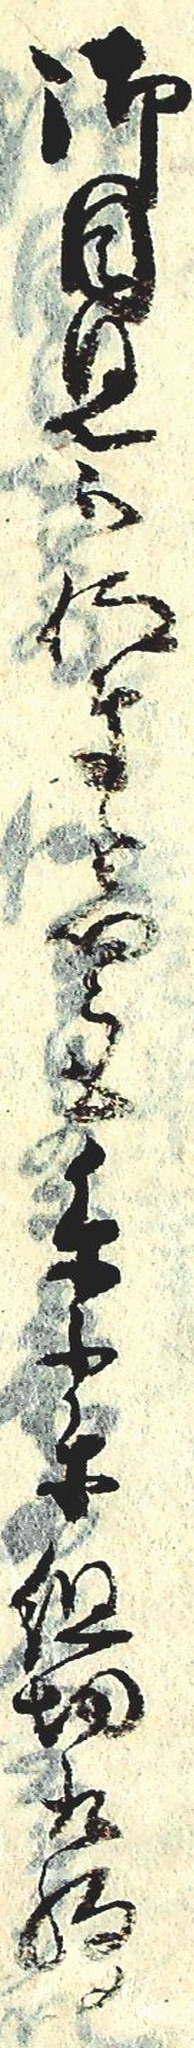御目見被仰付候者とも参不参組切相約め
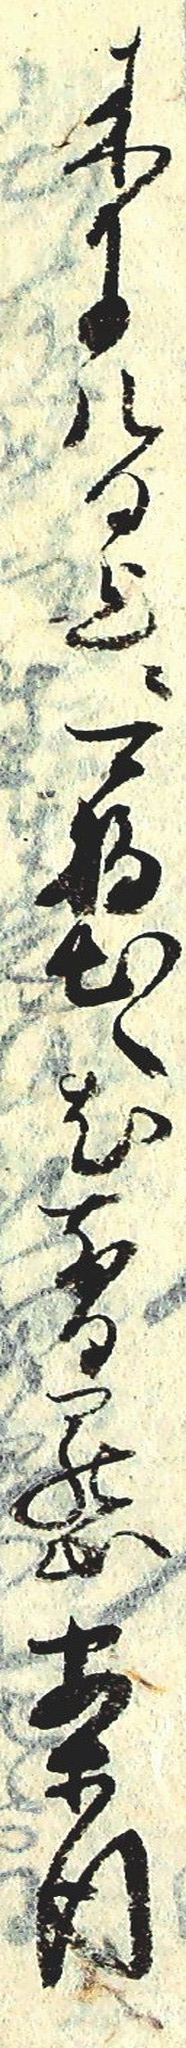来月八日迄に可指出候尤前日罷出案内
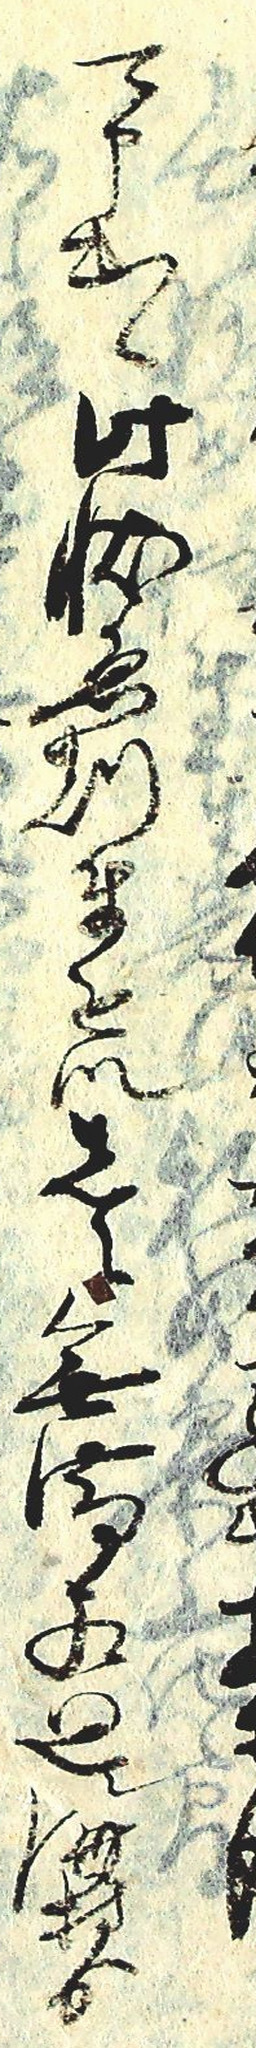可申出候此状急刻付を以先々無滞相廻し済村ゟ
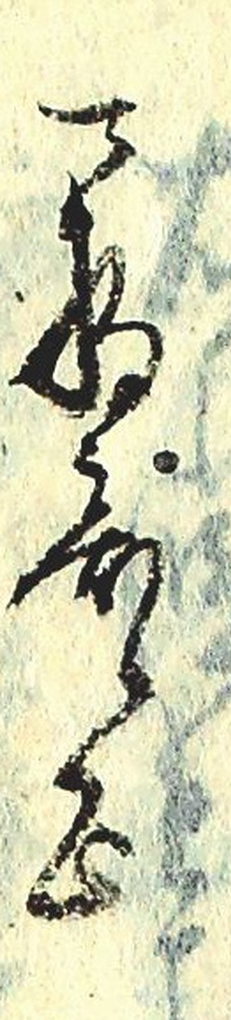可指戻候以上
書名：諸御願書控(弐番）
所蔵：鳴門教育大学 Naruto University of Education
